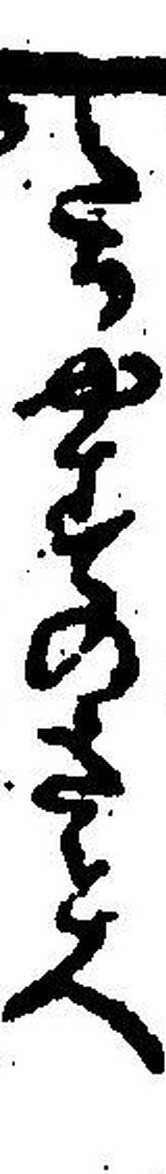たかやすのさとへ
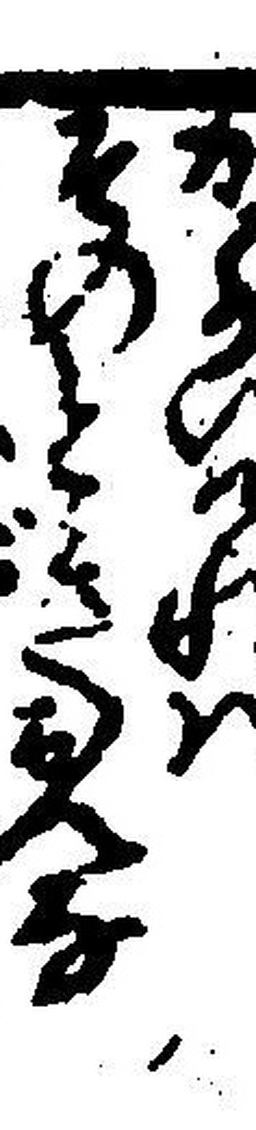そのときおんな
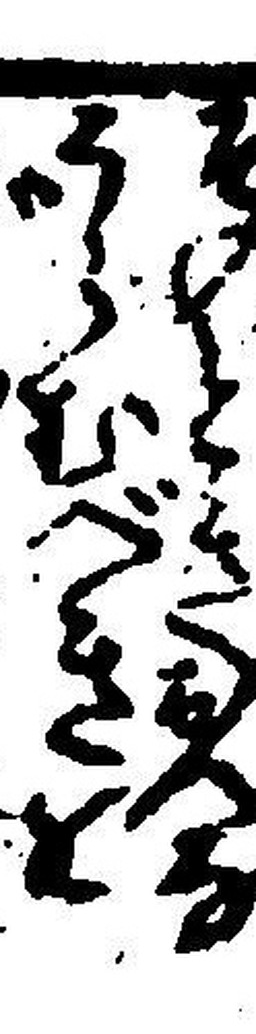うらむべきを
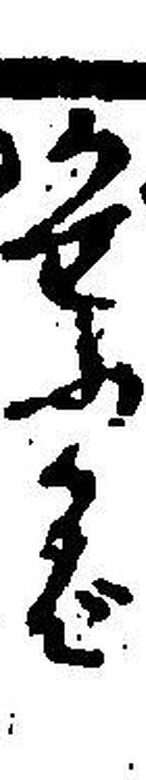かぜふかば
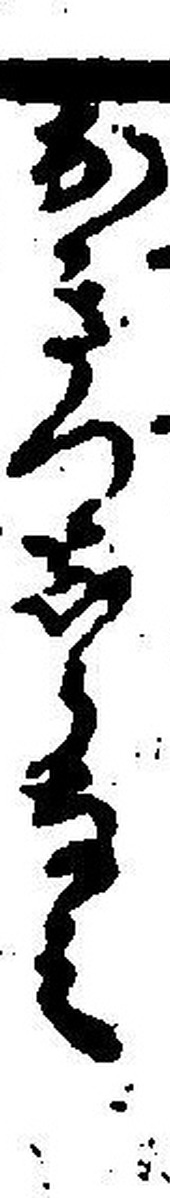おきつしらなみ
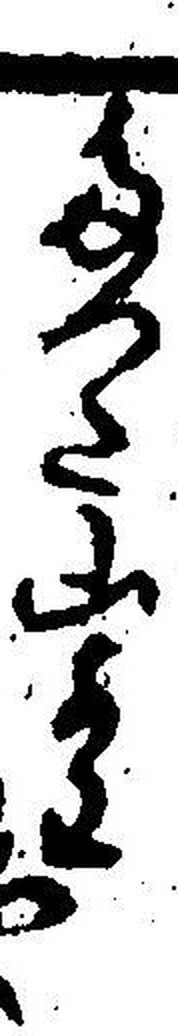たつた山よわ
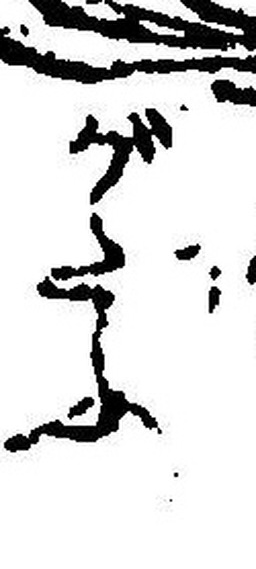がたふ
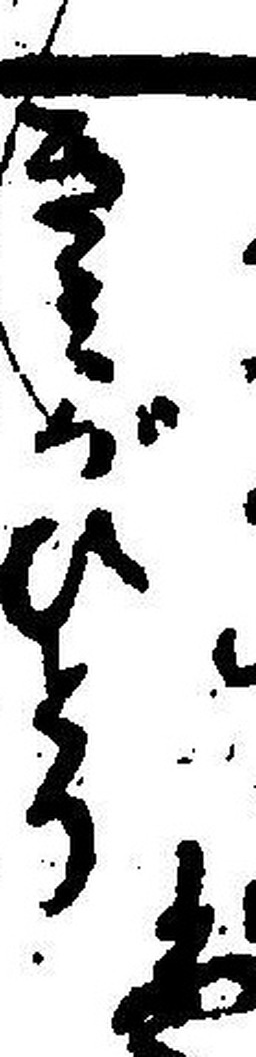きみがひとり
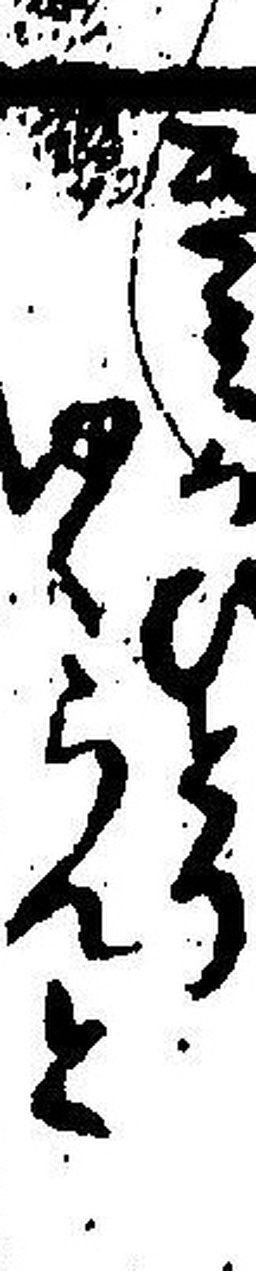ゆくらんと
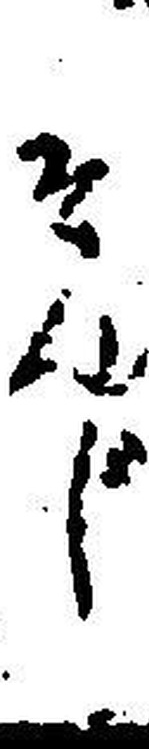ぞんじ
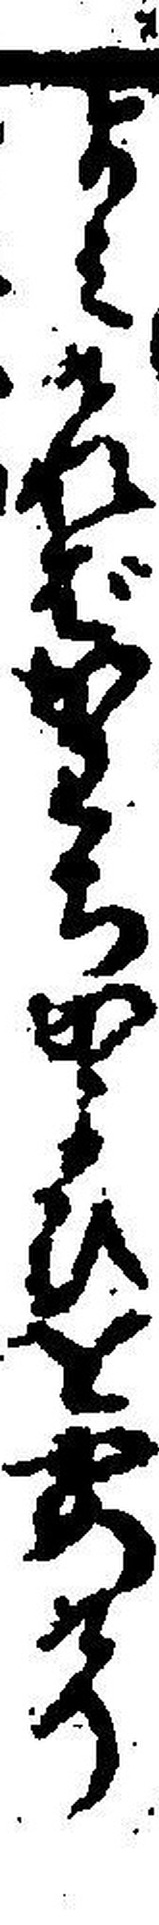よみければかわちかよひをやめけり
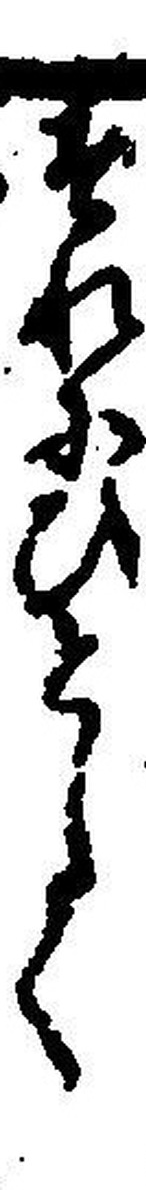それにひとしく
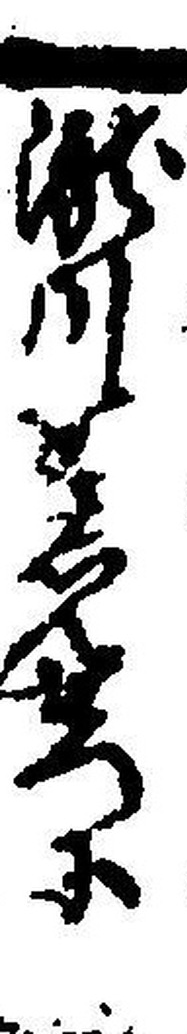滝川をしんせつに
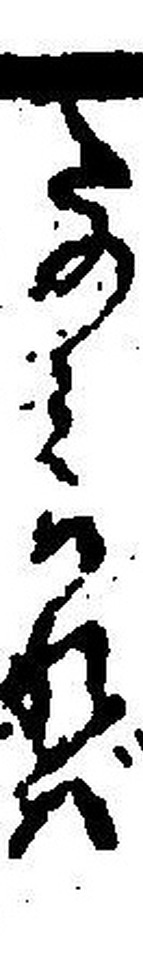たのみければ
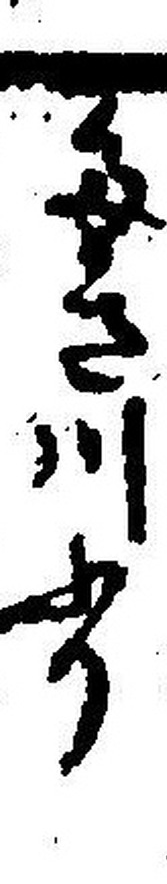たき川ふり
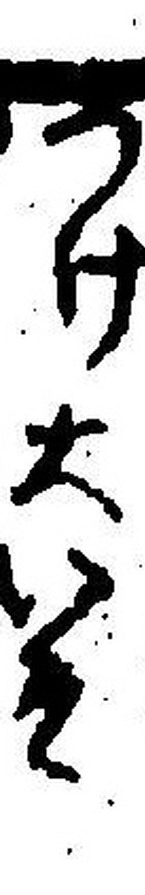つけ大いそ
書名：御代参牛時詣 / 市場通笑作
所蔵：東京大学総合図書館 General Library in the University of Tokyo, JAPAN
